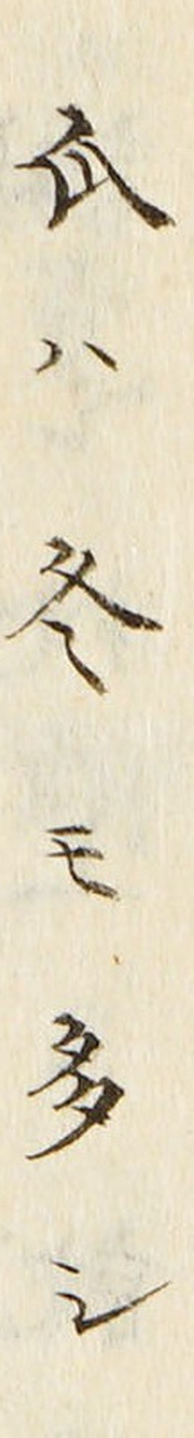瓜ハ冬モ多シ
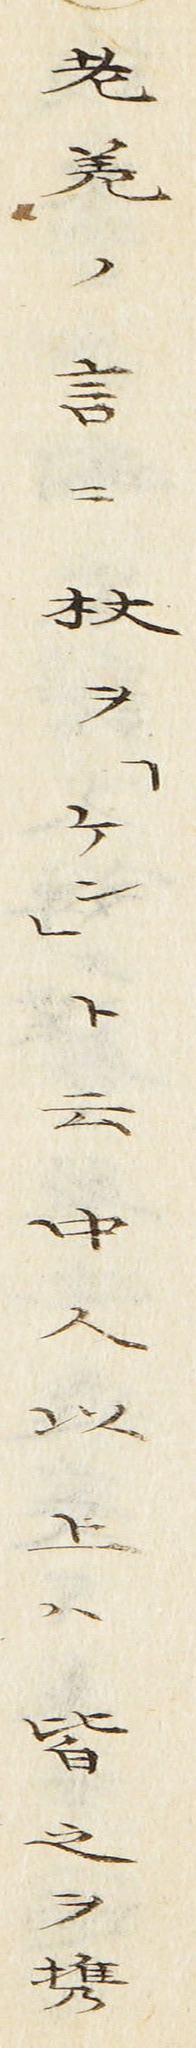〇老羗？ノ言ニ杖ヲ「ケン」ト云中人以上ハ皆之ヲ携
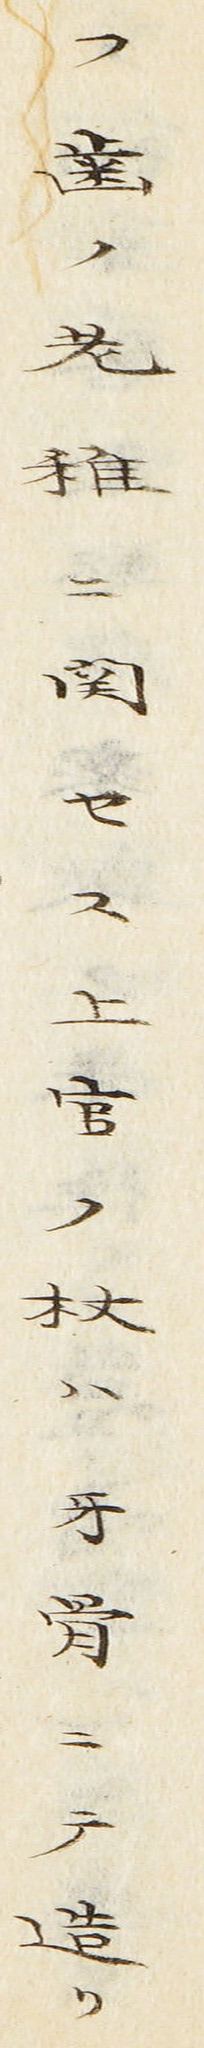フ歯ノ老稚ニ関セス上官ノ杖ハ牙骨ニテ造リ
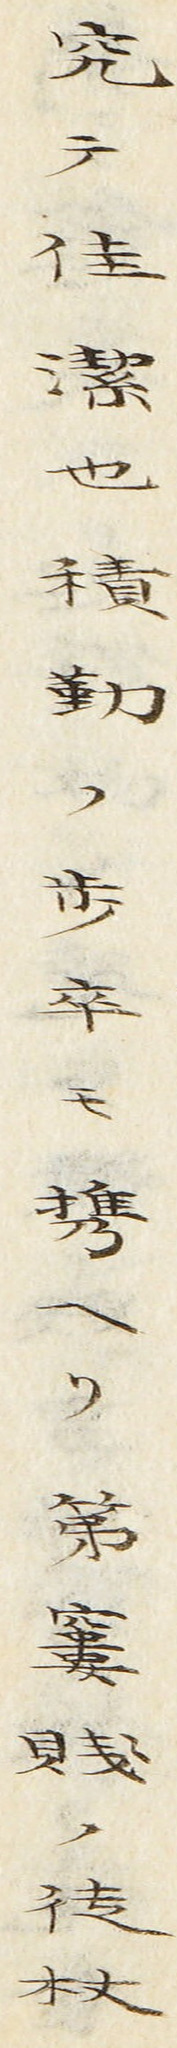究テ佳潔也積勤ノ歩卒モ携ヘリ第窶賤ノ徒杖
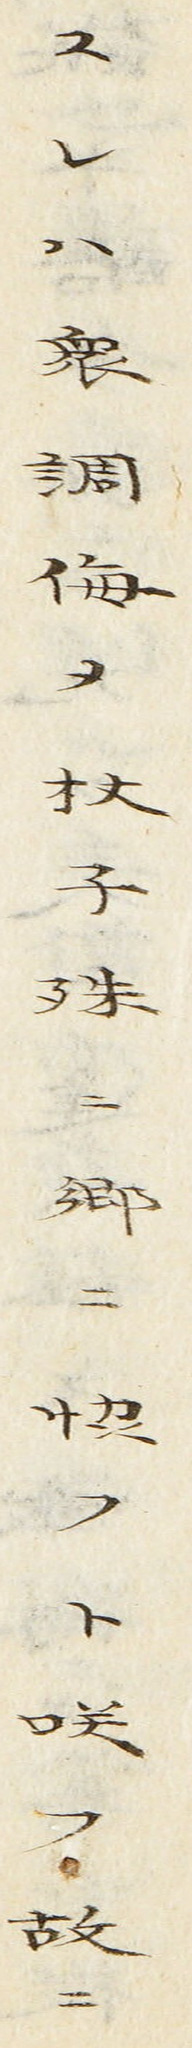スレハ衆調侮シテ杖子殊ニ郷ニ恊フト咲フ故ニ
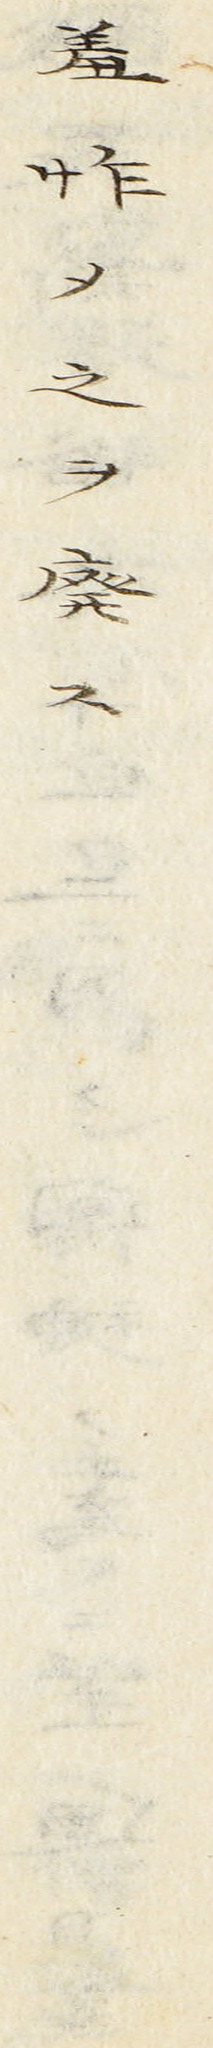羞怍シテ之ヲ廃ス
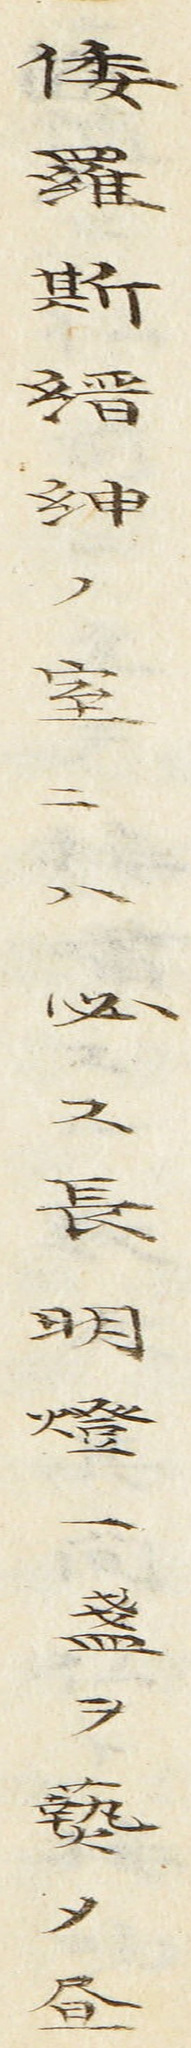〇倭羅斯縉紳ノ室ニハ必ス長明灯一盞ヲ爇？シテ昼
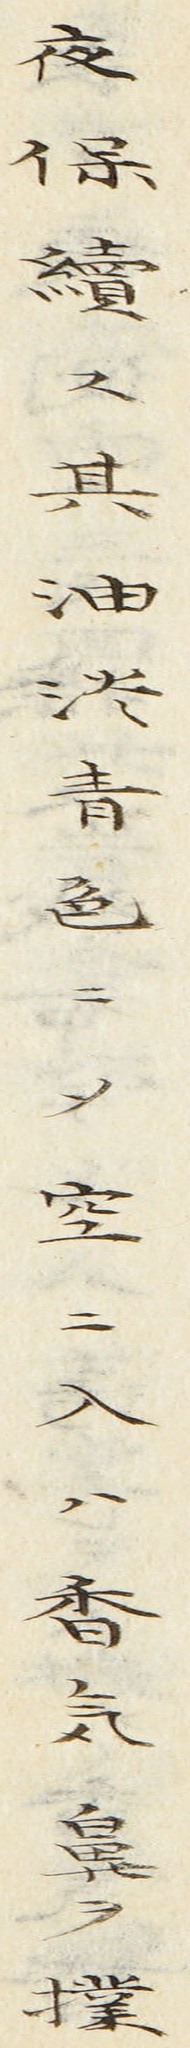夜保続ス其油淡青色ニシテ空ニ入ハ香気鼻ヲ撲
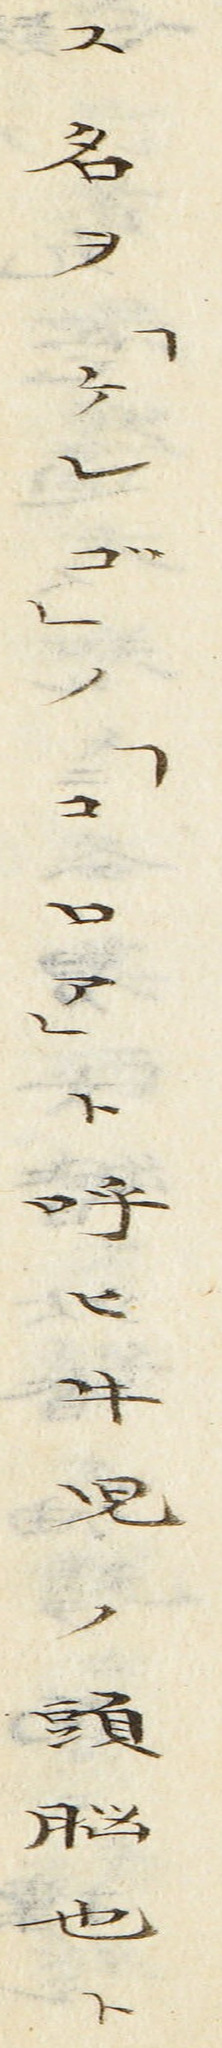ス名ヲ「ケレゴ」ノ「コロア」ト呼ヒ牛児ノ頭脳也ト

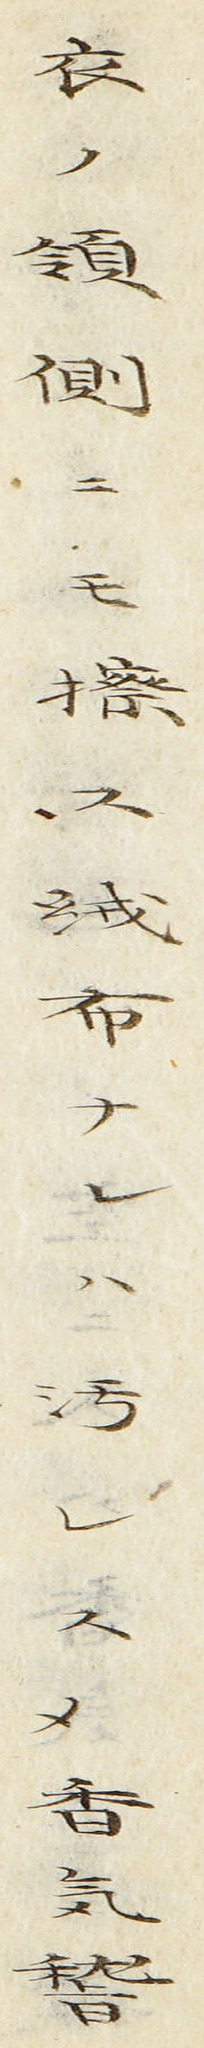衣ノ領側ニモ擦ス絨布ナレハ汚レスメ香気稽
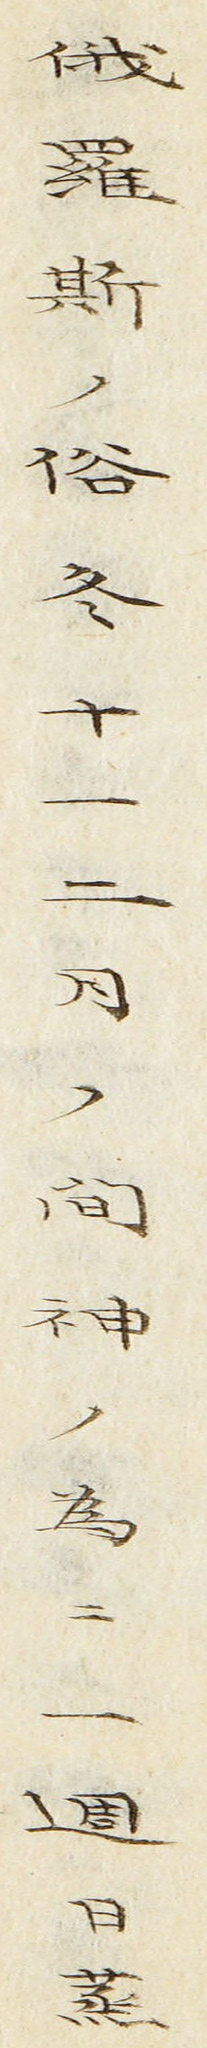俄羅斯ノ俗十一二月ノ間神ノ為ニ一週日蒸
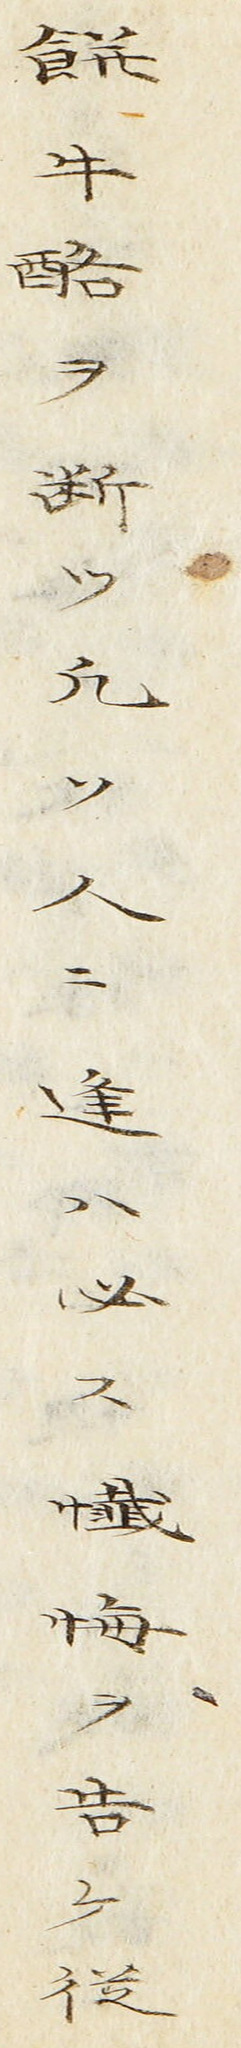餅牛酪ヲ断ツ凡ソ人ニ逢ハ必ス懺悔ヲ告ケ従
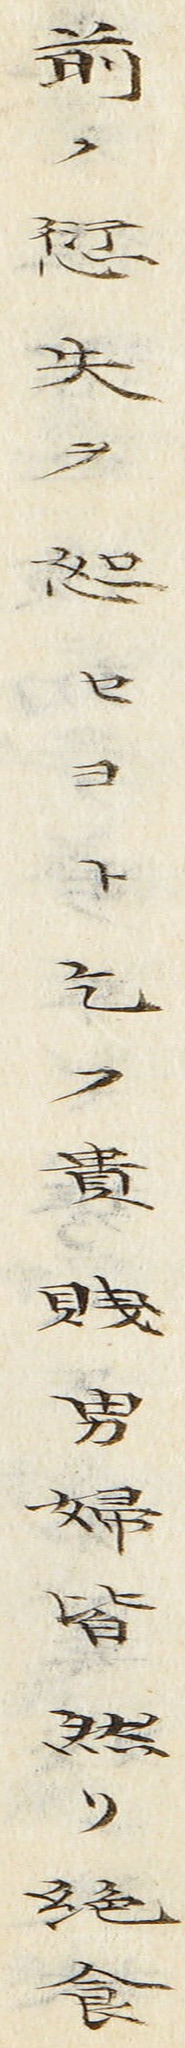前ノ愆失ヲ恕セヨト乞フ貴賤男婦皆然リ絶食
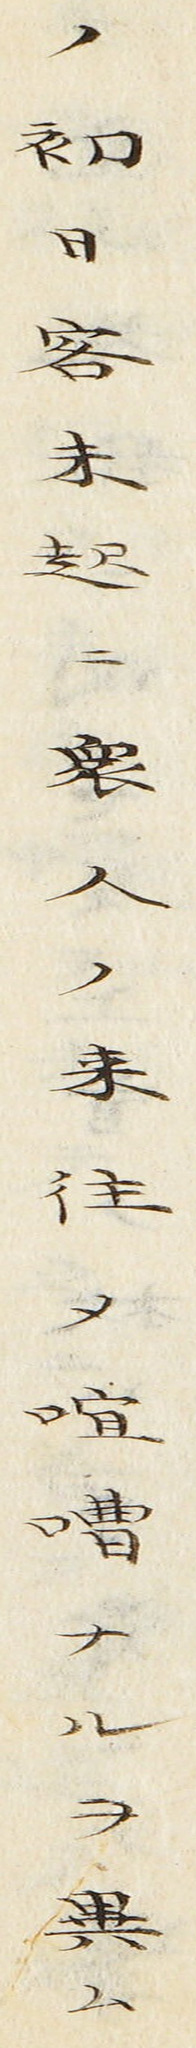ノ初日客未起ニ衆人ノ来往シテ喧嘈ナルヲ異ム
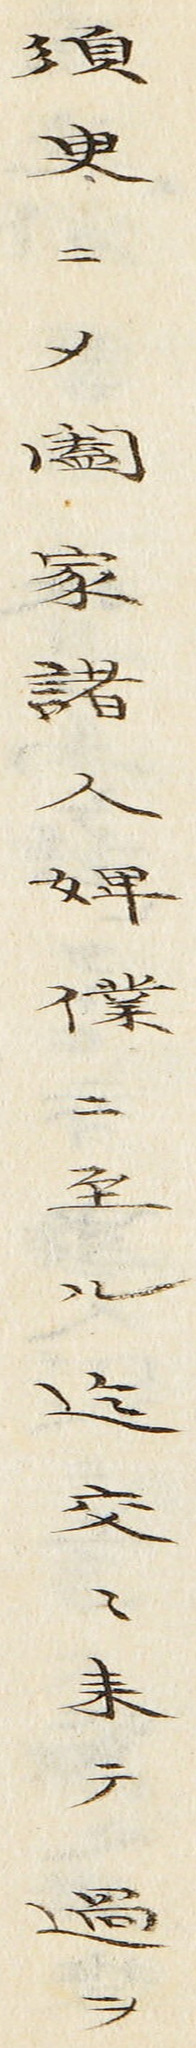須臾ニシテ闔家諸人婢僕ニ至ル迄交々来テ過ヲ
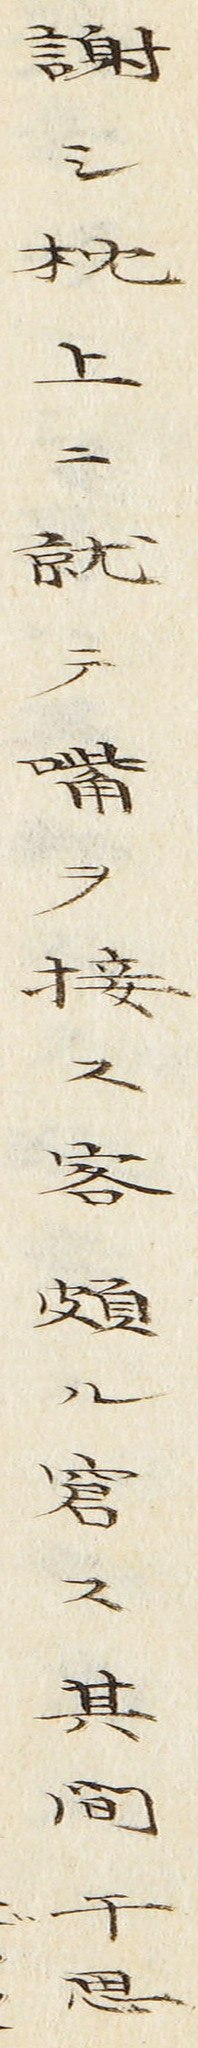謝シ枕上ニ就テ嘴ヲ接ス客頗ル窘ス其間干思
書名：蕃談
